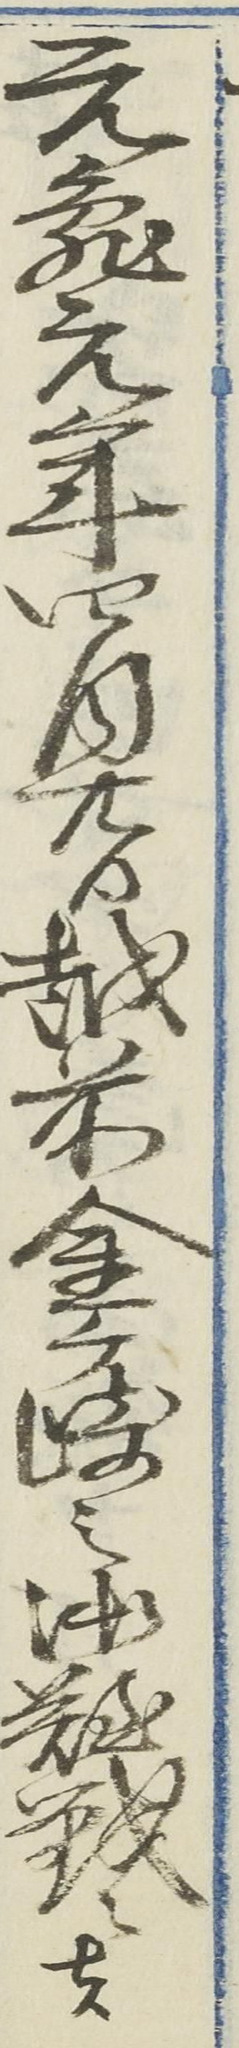元亀元年四月廿日越前金ケ崎之御難戦ニ候
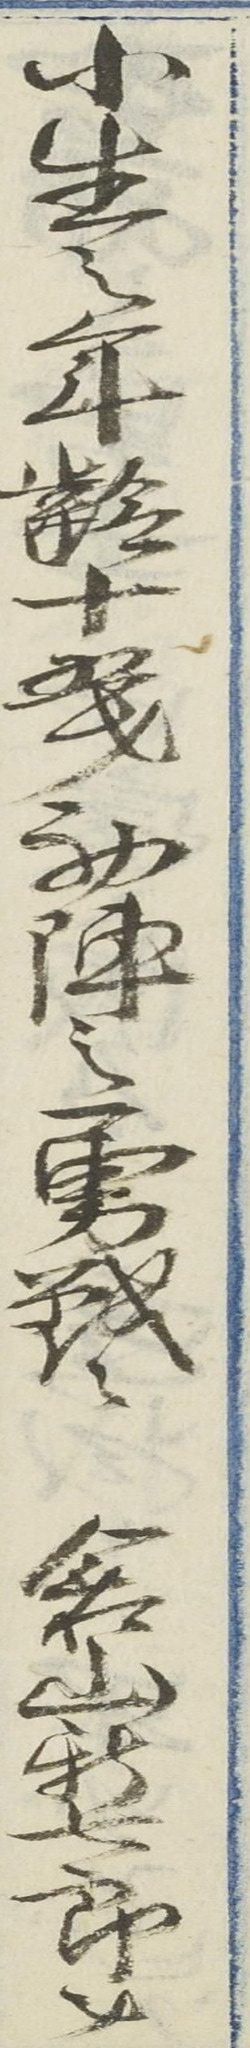小生之年齢十五才初陣シ勇戦二倉山新七郎ヲ
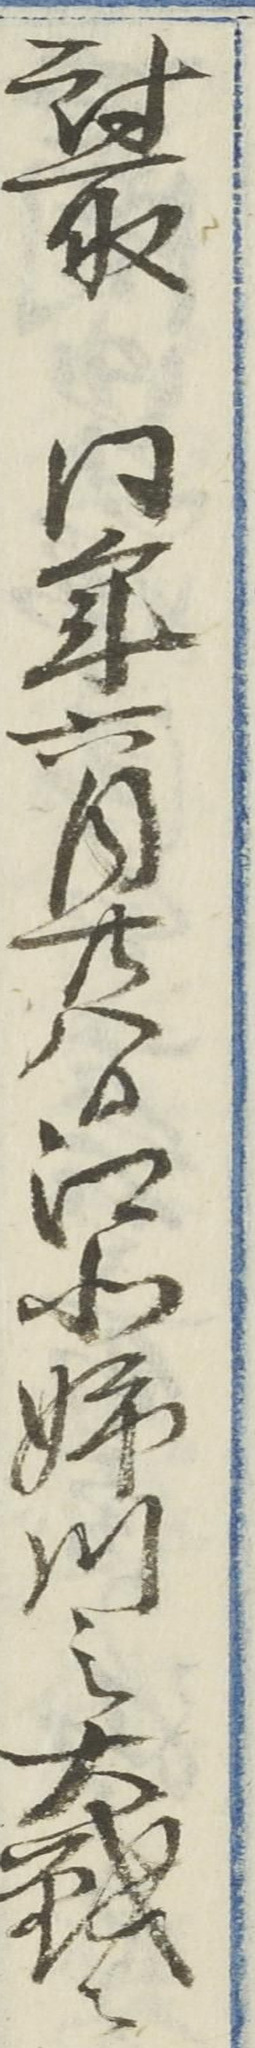討取同年六月廿八日江北姉川之大戦ニ
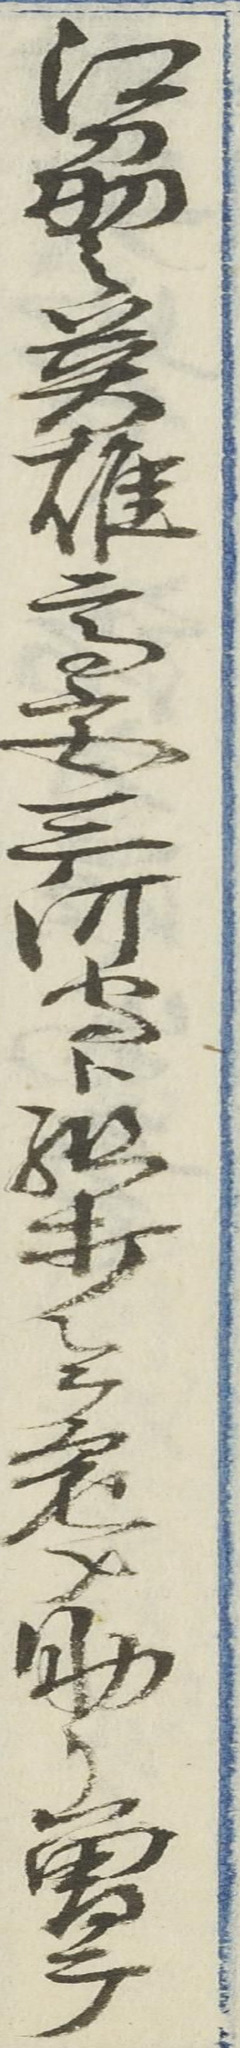江州之英雄高宮三河守ト組打シテ危ヲ助リ曾テ
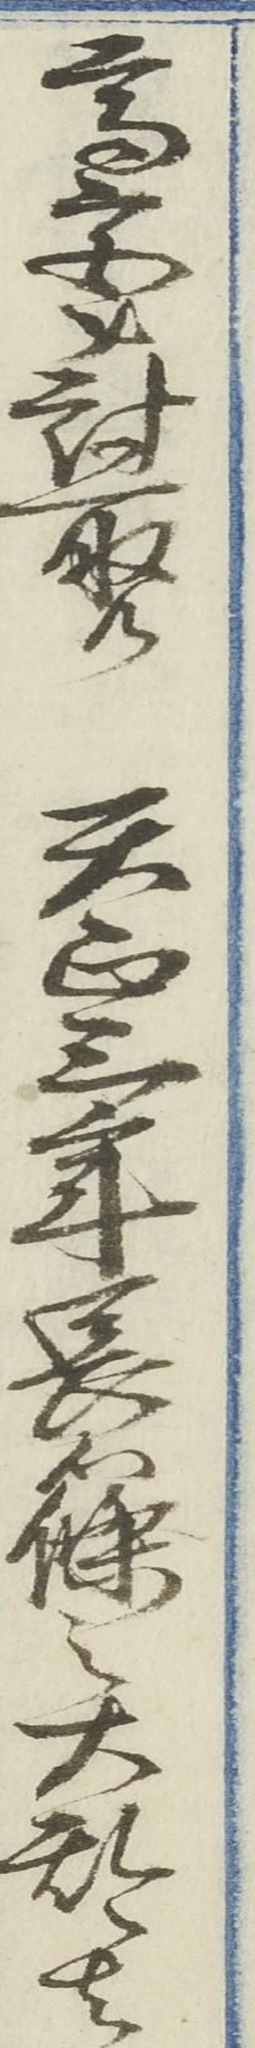高宮ヲ討取ル天正三年長篠之大乱二は
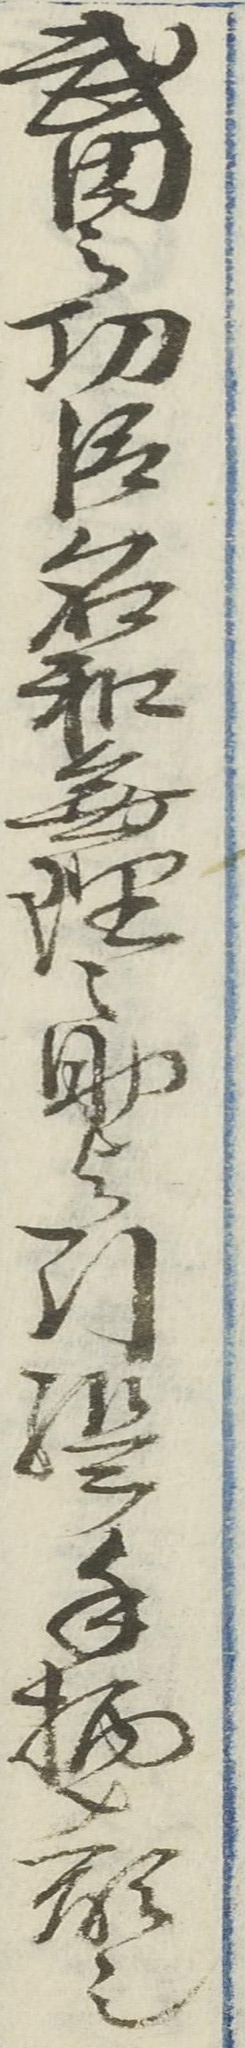武田之功臣名和無理之助と引組テ手柄ヲ顕シ
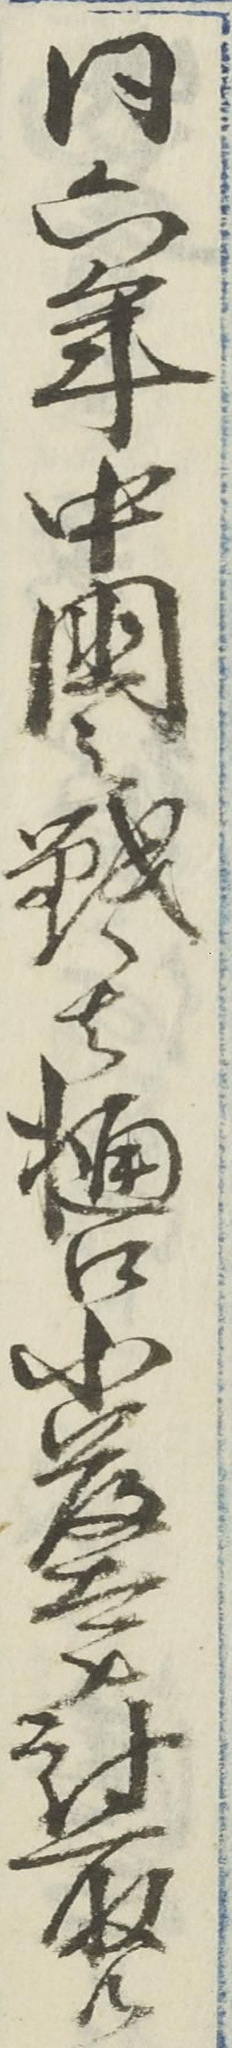同六年中国之戦ニは樋口小藤太ヲ討取ル
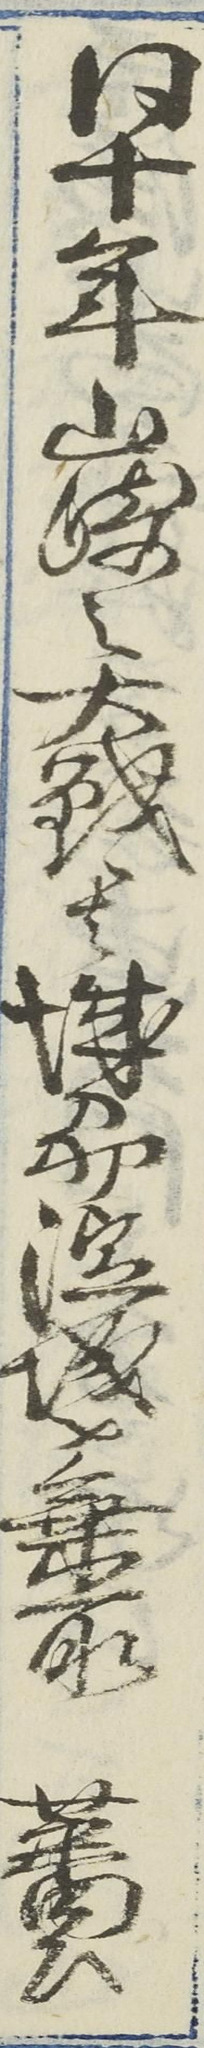同十年山崎之大戦ニは城州淀城ヲ乗取蕃？ひ
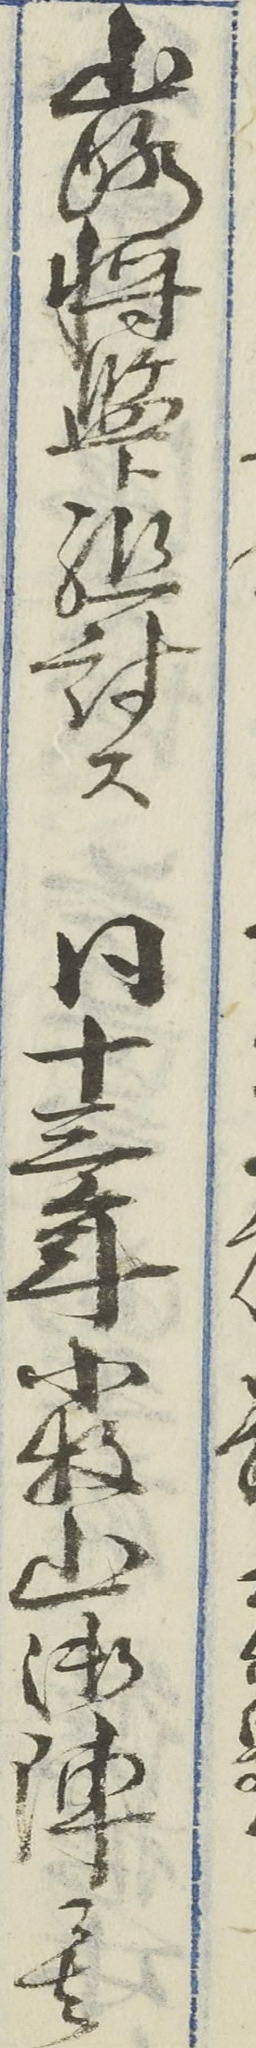山崎将監ト組討ス同十三年小牧山御陣ニは
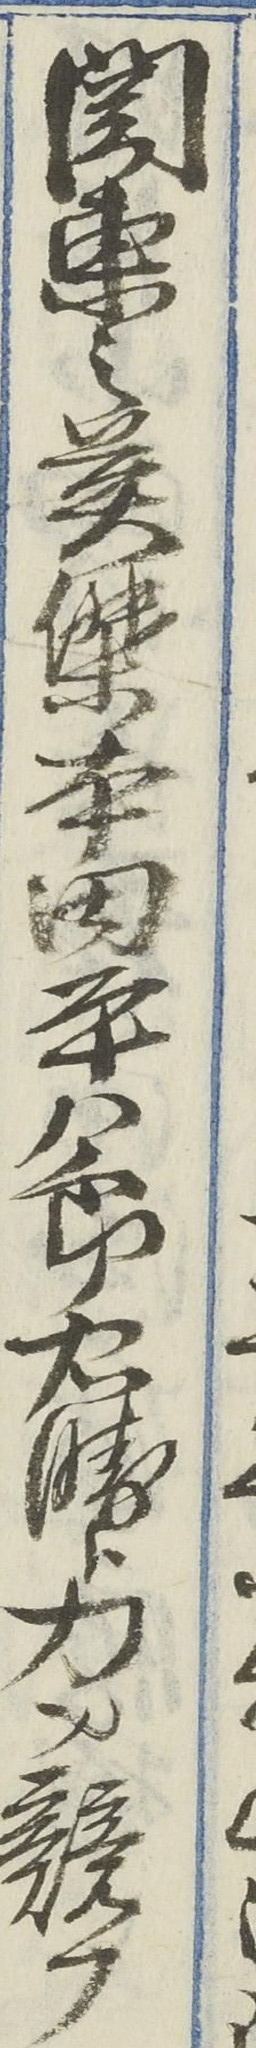関東之英傑本田平八郎忠勝ト力ヲ競フ
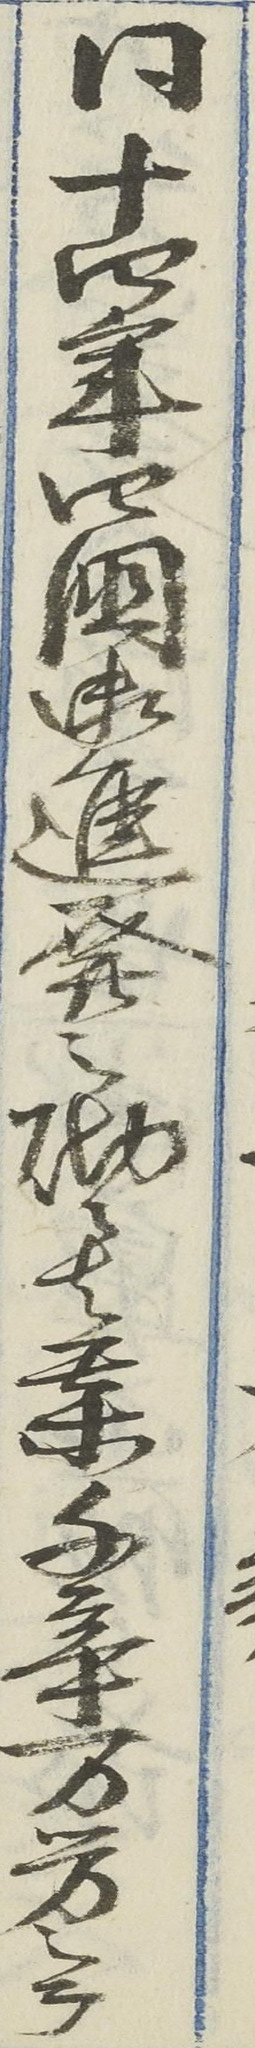同十四年四国御進発之砌は某千辛万労シテ
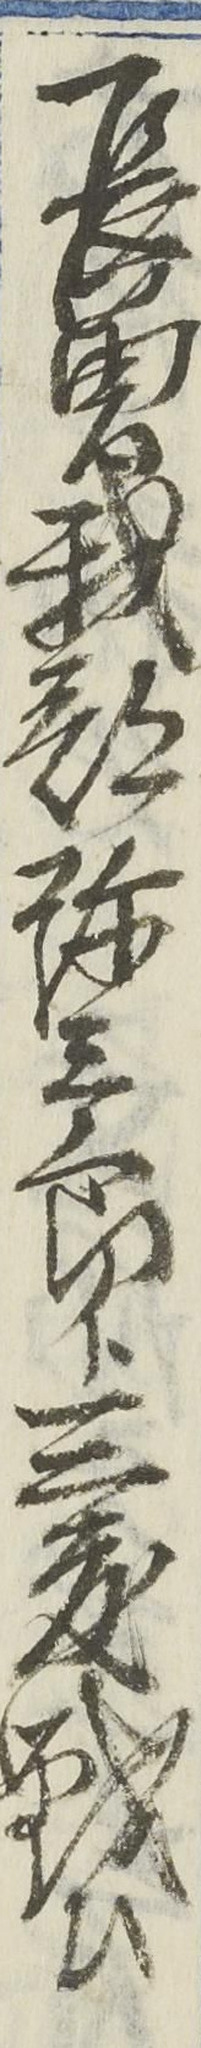長曽我部弥三郎ト三度戦ひ
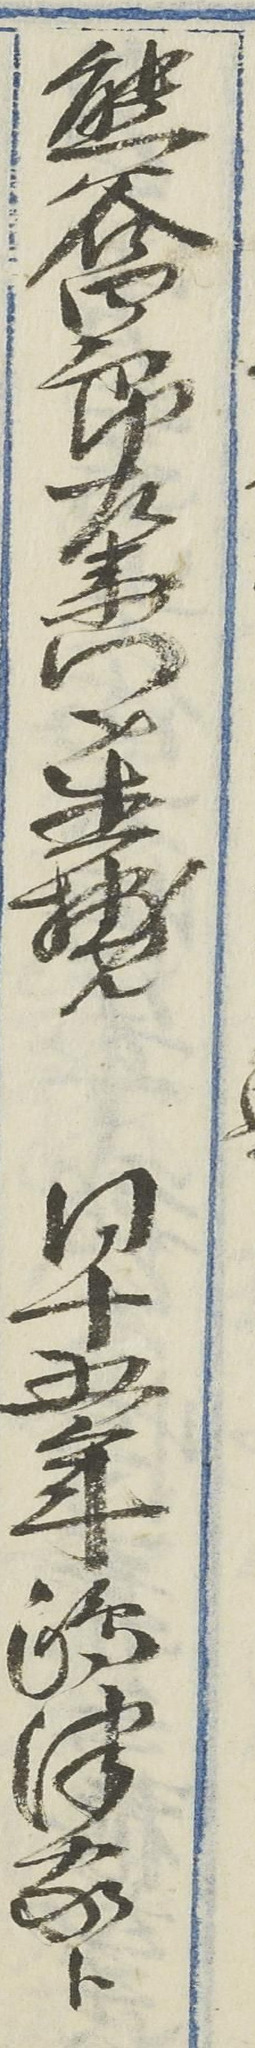熊谷四郎左衛門ヲ生捕ル同十五年島津家ト
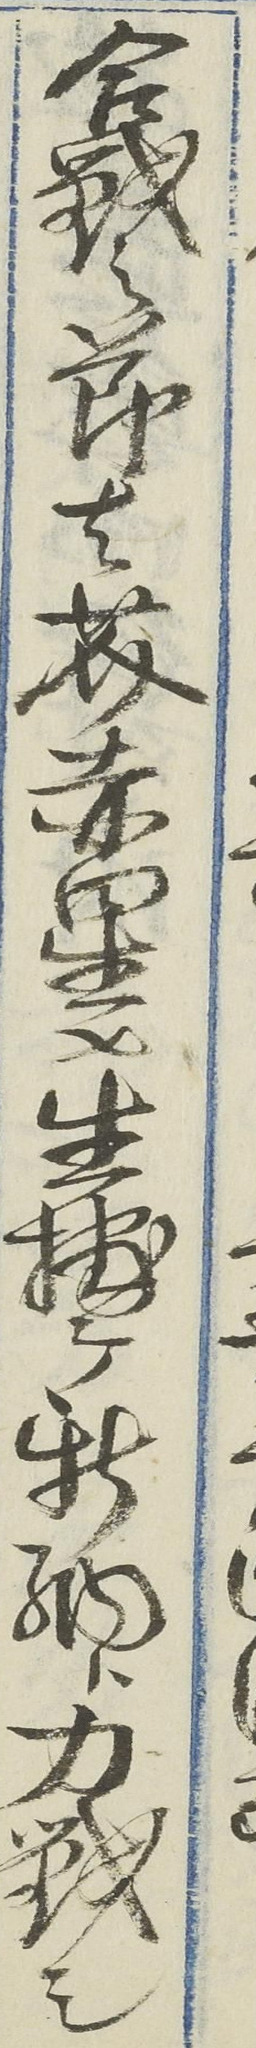合戦之節は芥赤星ヲ生捕テ新納ト力戦シ
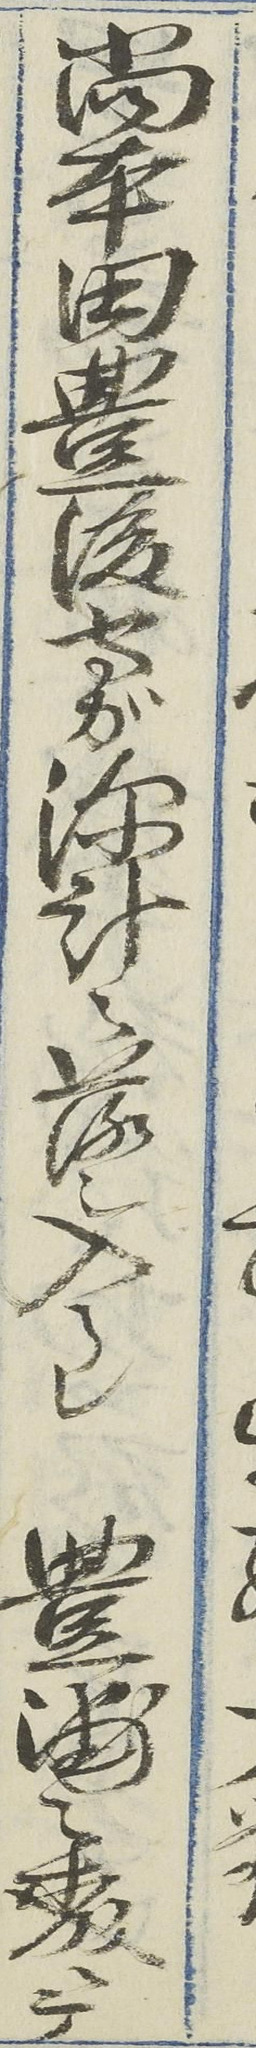尚本田豊後守ガ深計ニ落シ入ラレ豊浦之森ニテ
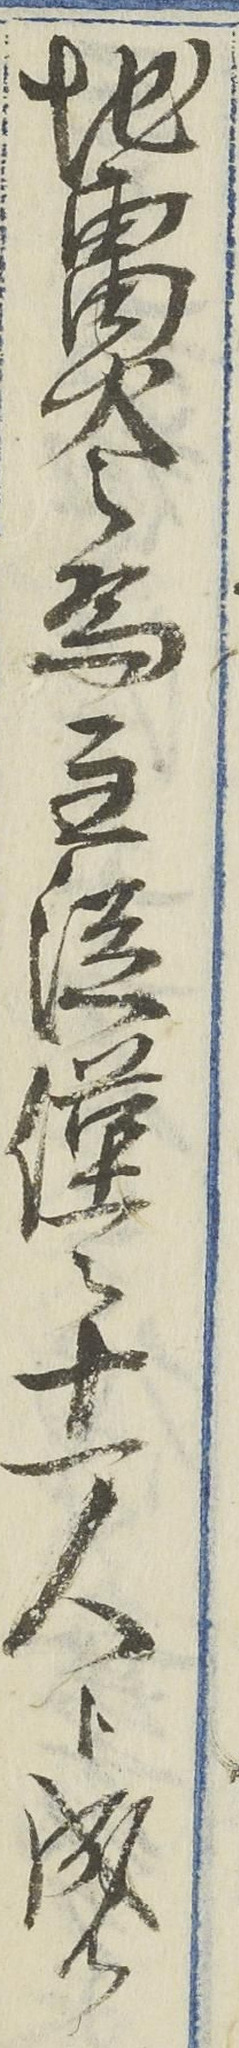地雷火之為主従僅ニ十一人ト成ル
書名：伏水大地震
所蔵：東京大学地震研究所図書室 Earthquake Research Institute Library, The University of Tokyo, JAPAN
